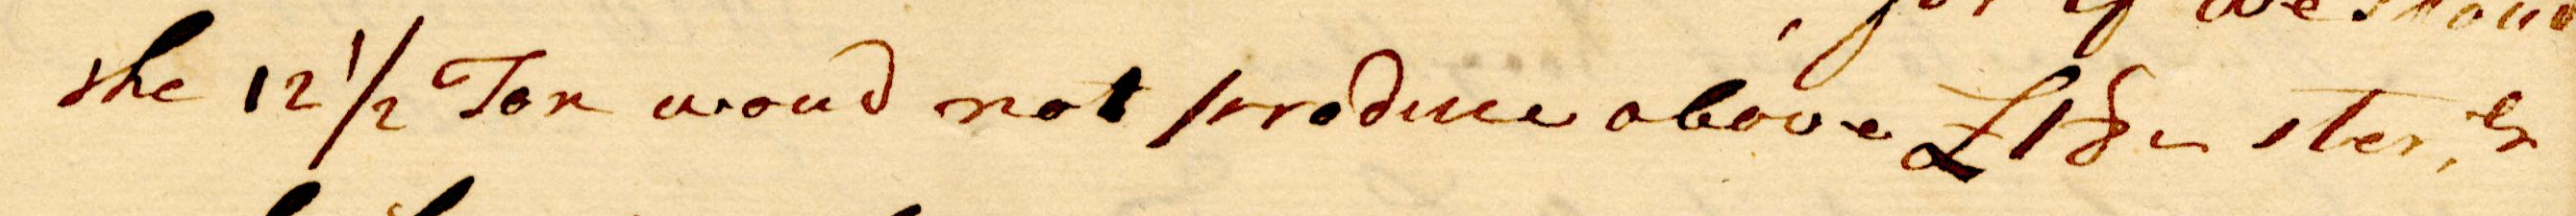the 12 1/2 Ton woud not produce above £18- ster^g.
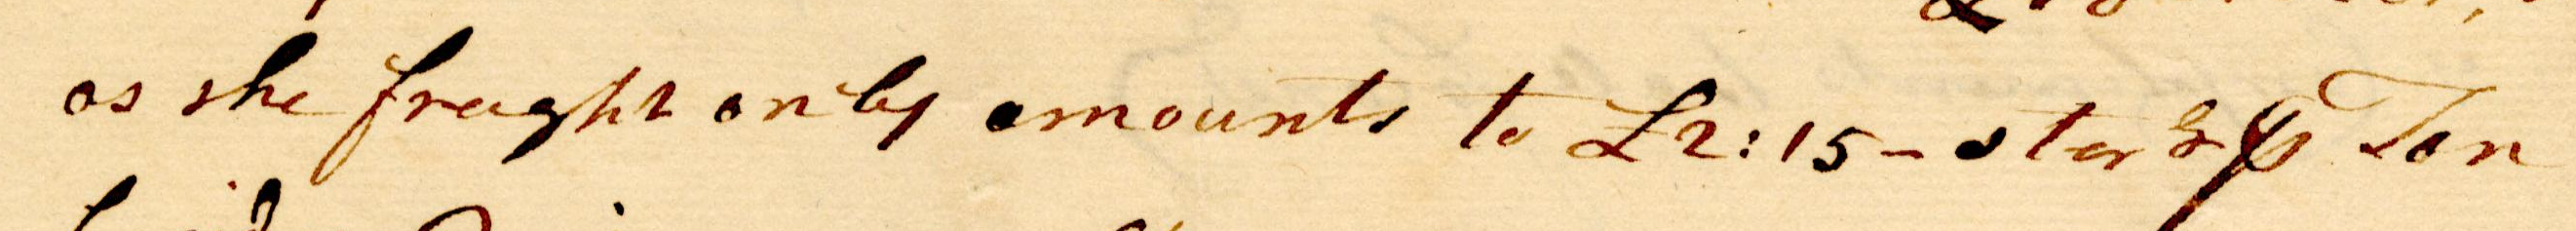as she freight only amounts to £2:15- ster^g per Ton
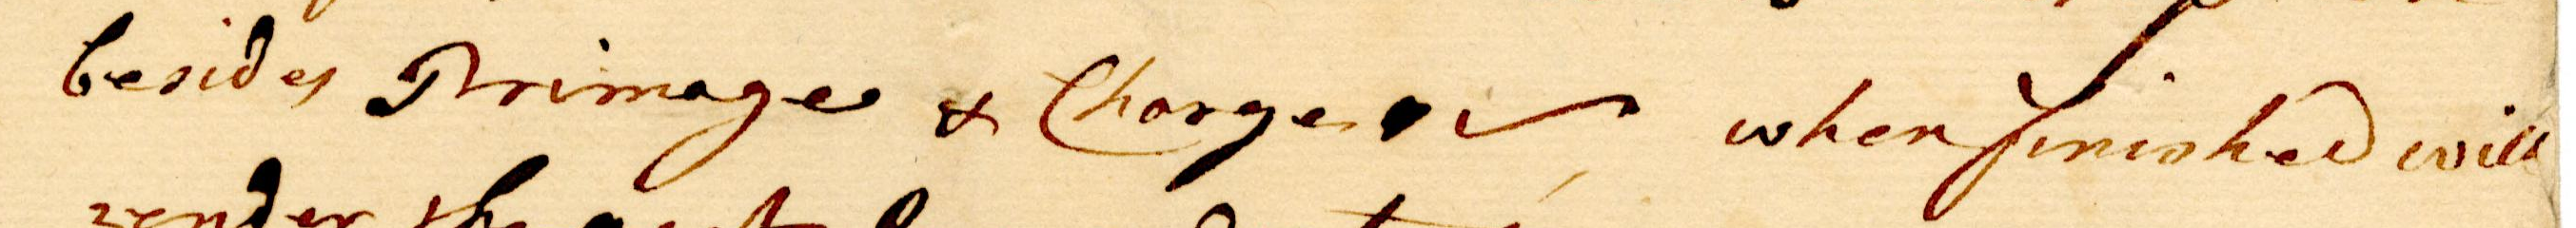besides primage & Charge- when finished will
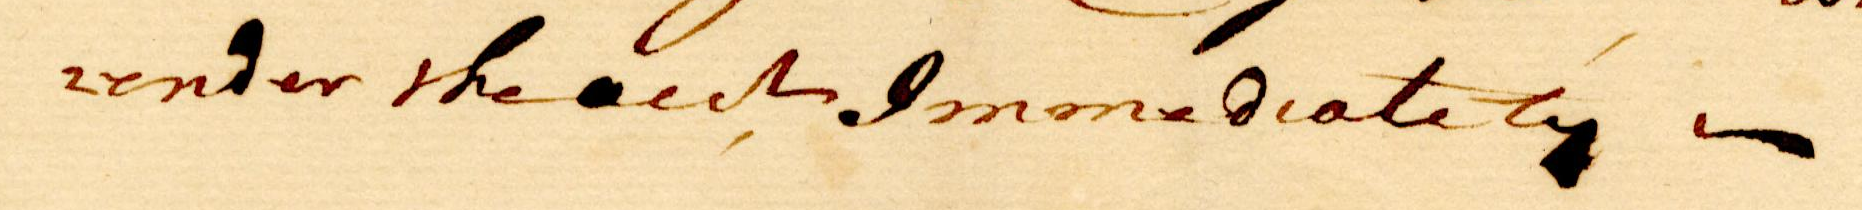render the acc^t Immediately-
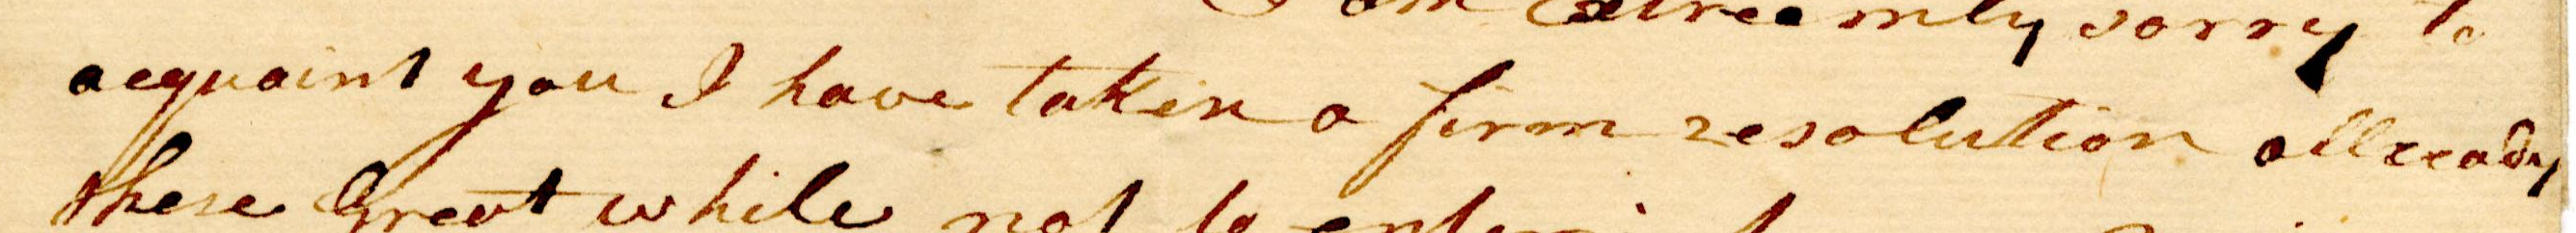acquaint you I have taken a firm resolution allready
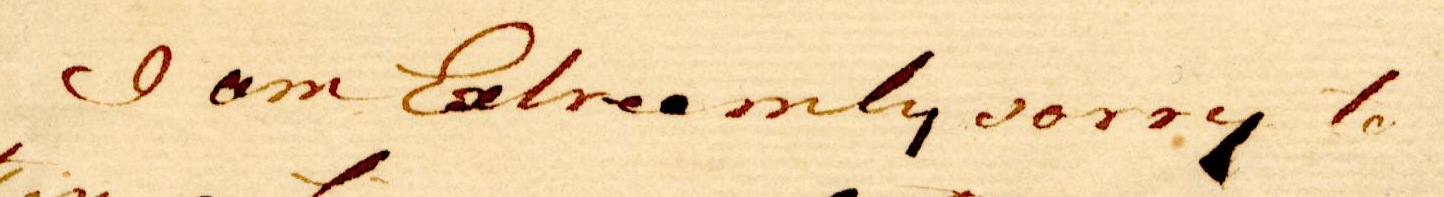I am Extreemly sorry to
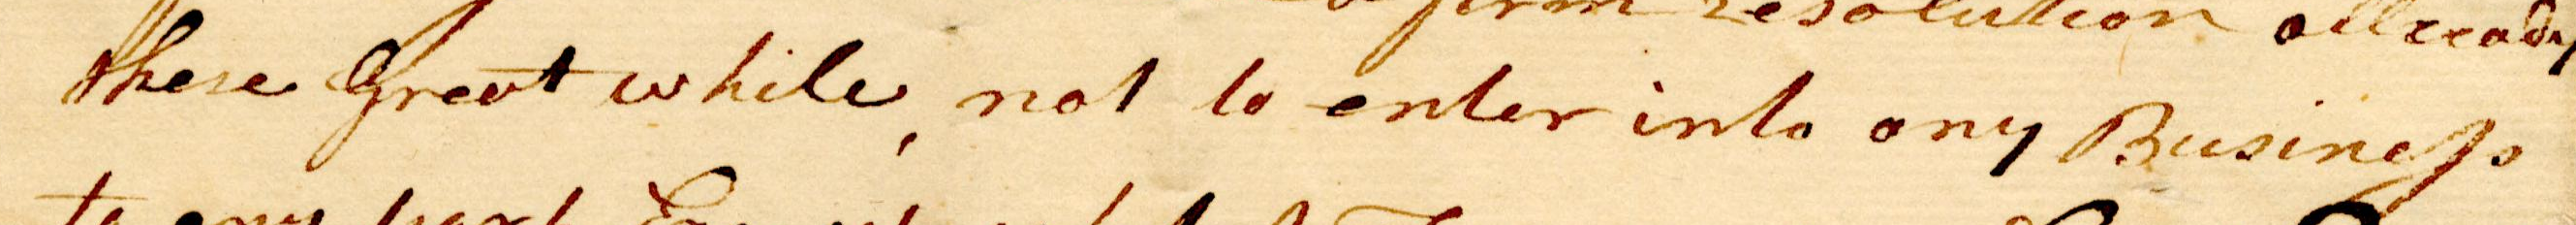these Great while not to enter into any Business
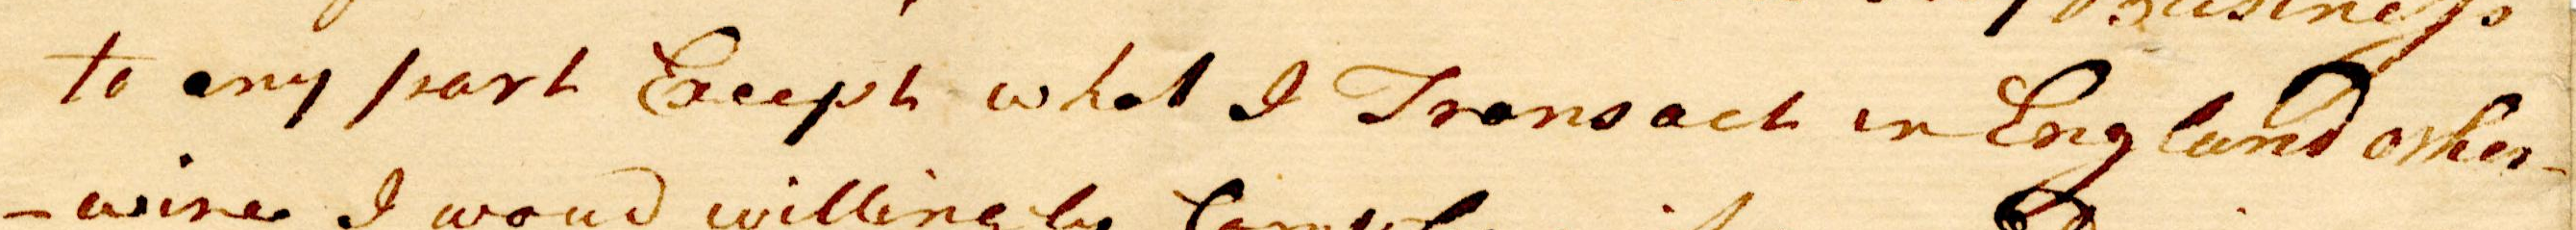to any part Except what I Transact in England other-
